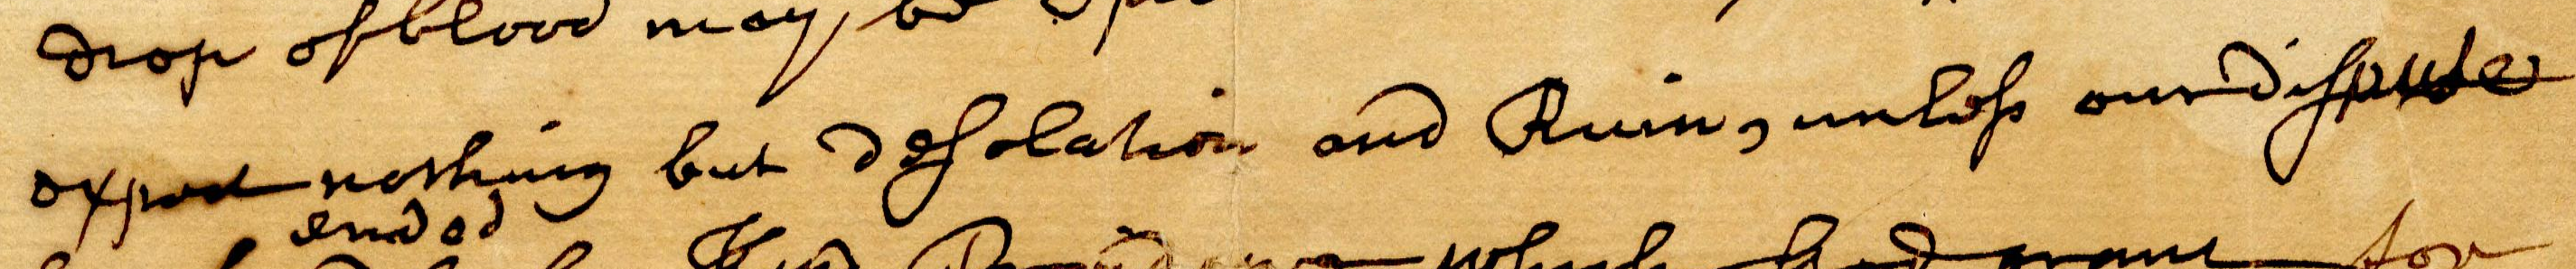expect nothing but desolation and Ruin, unless our dispute
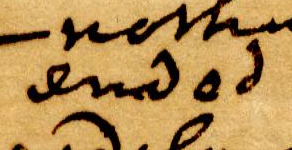ended
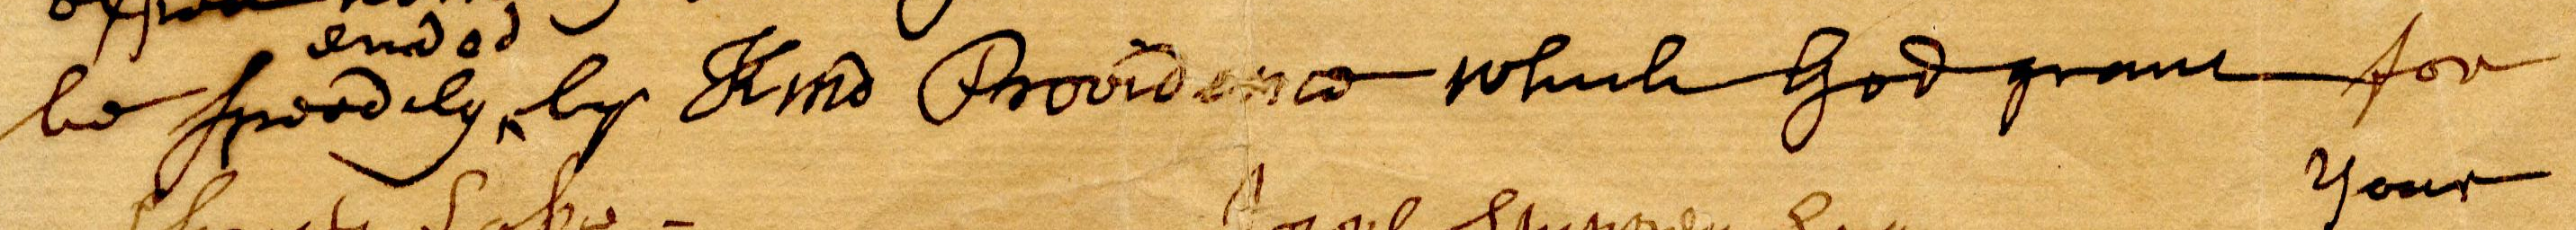be speedily ^ by Kind Providence-which God grant for
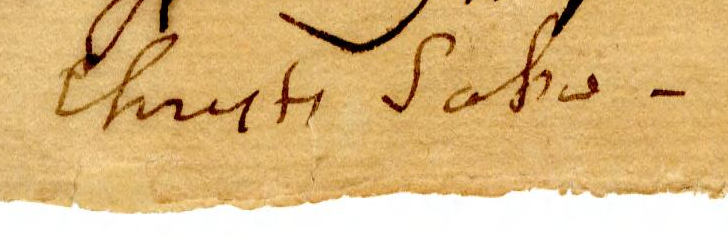Christs Sake-
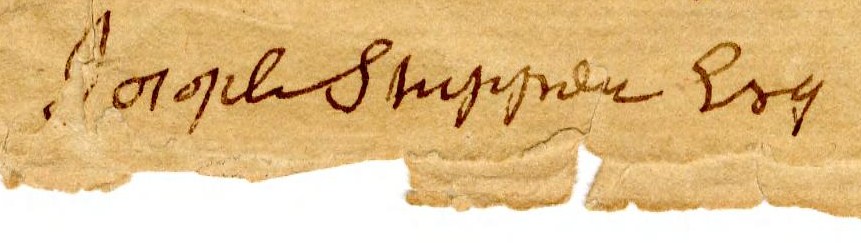Joseph Shippen Esq
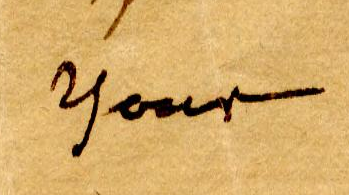Your
